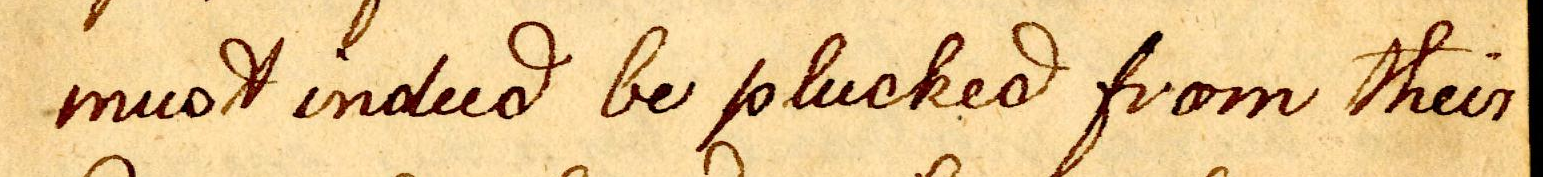must indeed be plucked from their
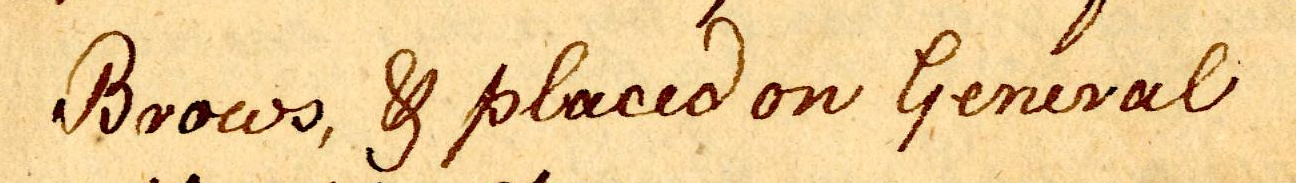Brows, & placed on General
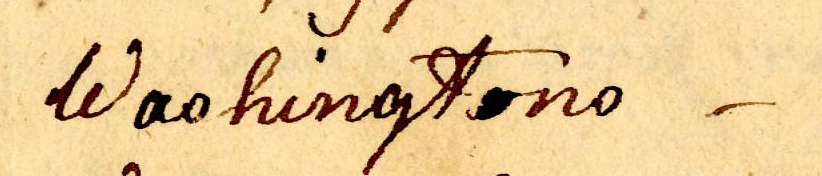Washingtons-
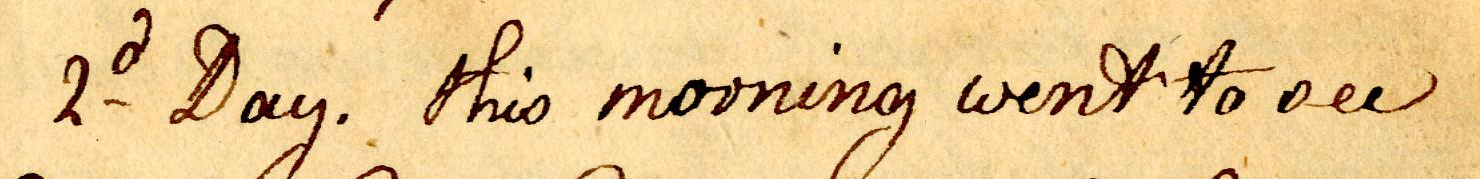2^d Day, this morning went to see
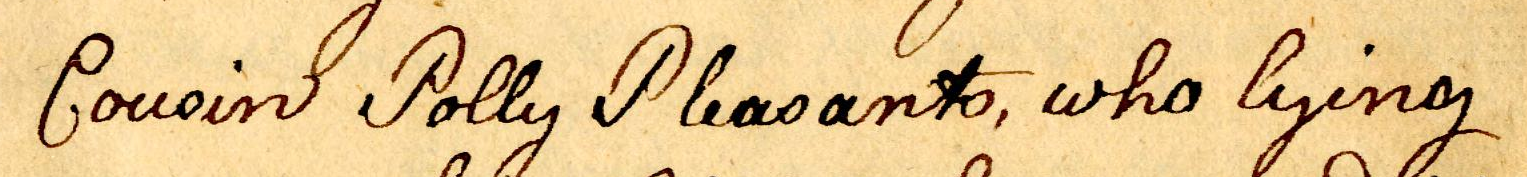Cousin Polly Pleasants, who lying
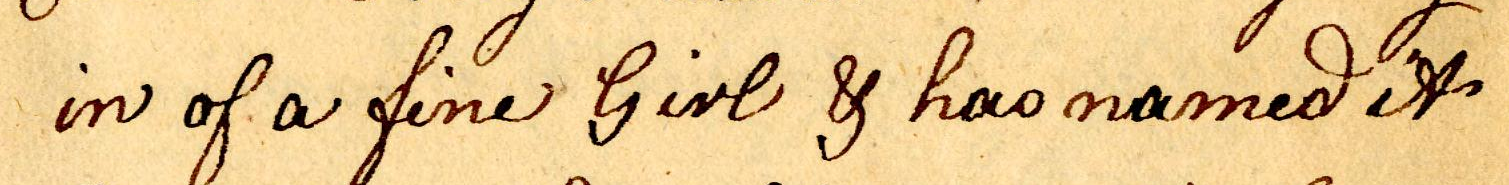in of a fine Girl & has named it
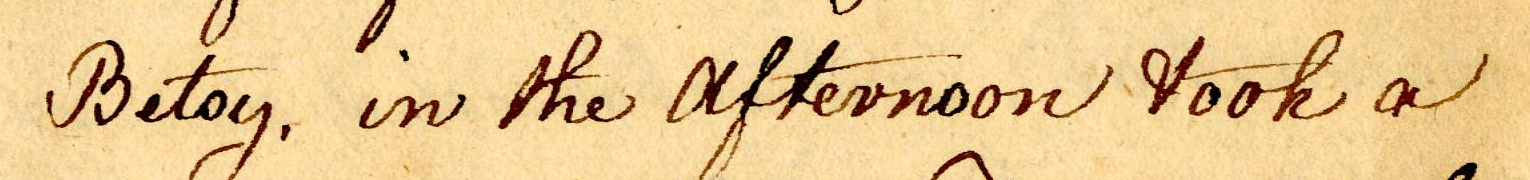Betsy. in the Afternoon took a
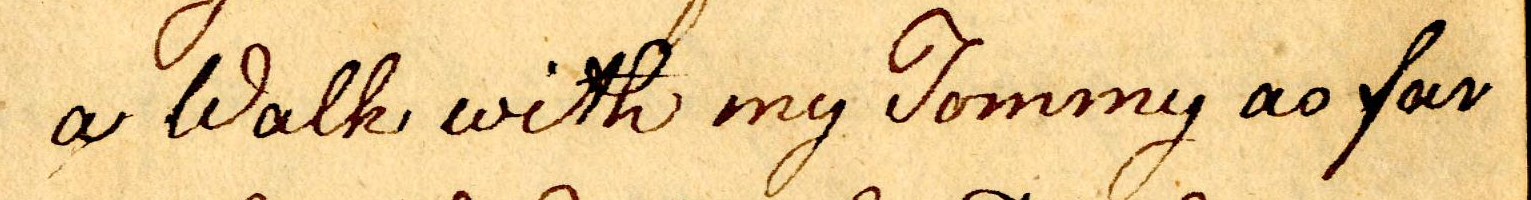a Walk with my Tommy as far
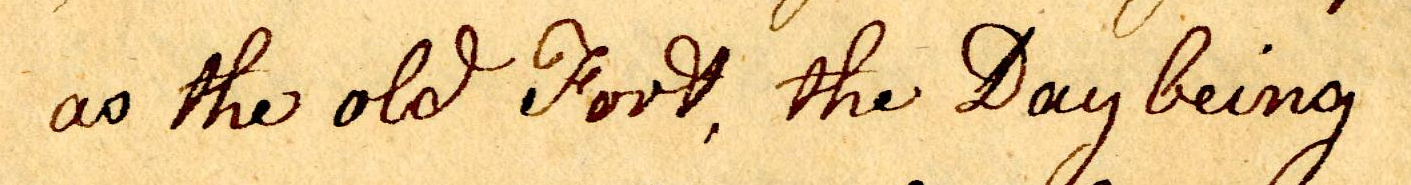as the old Fort, the Day being
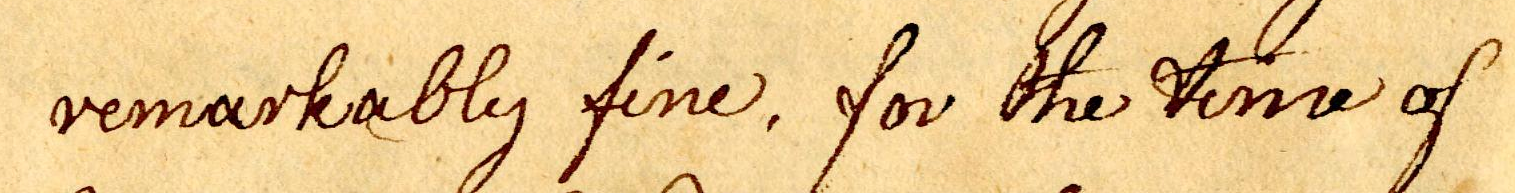remarkably fine, for the time of
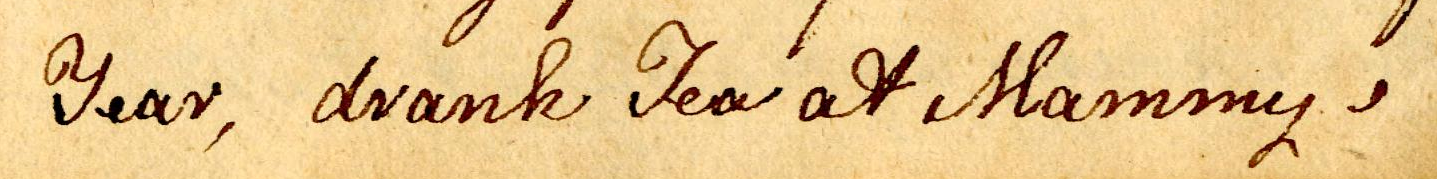Year, drank Tea at Mammys
